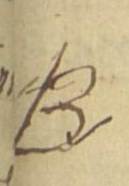B
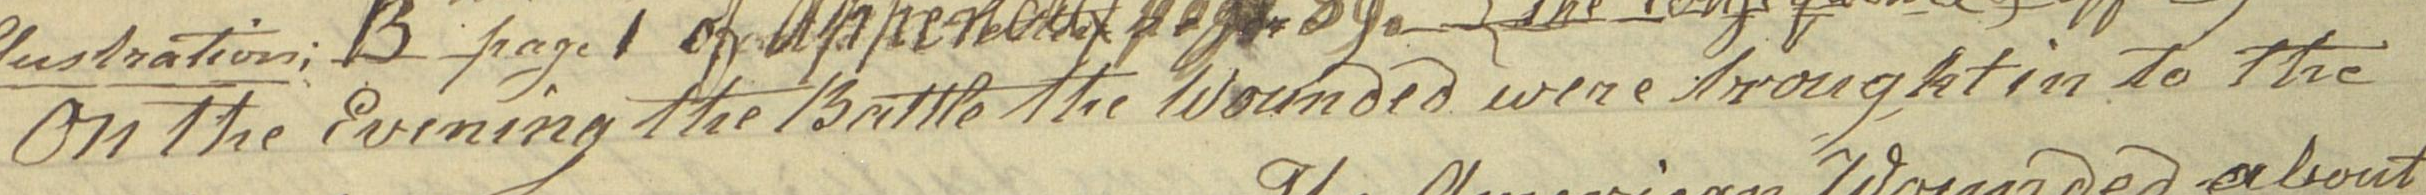Ons the Evening the Battle the Wounded were brought in to the
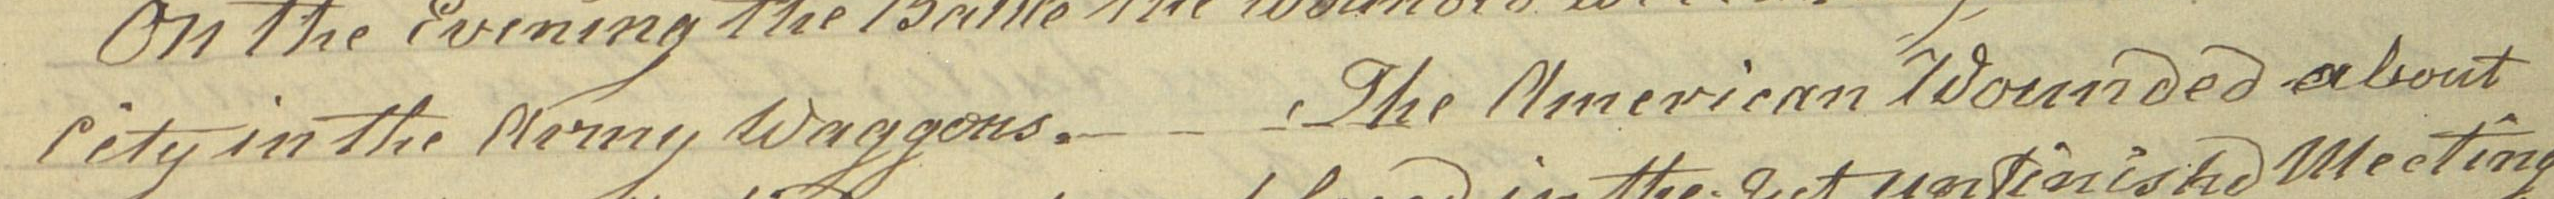City in the Army Waggons. The American Wounded about
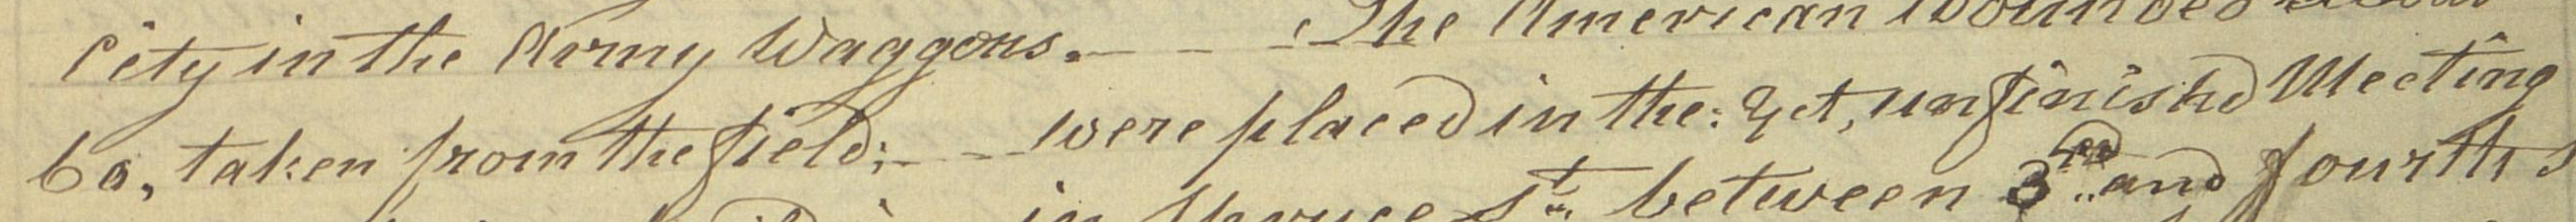60, taken from the field; were placed in the yet, unfinished Meeting
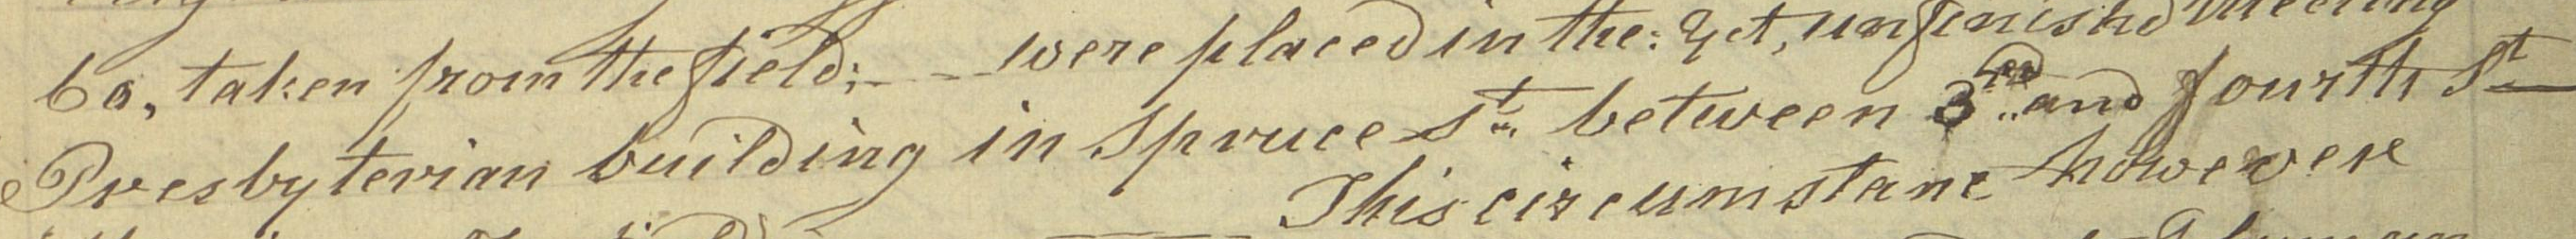Presbyterian building in Spruce S^t. between 3^rd. and fourth S^t
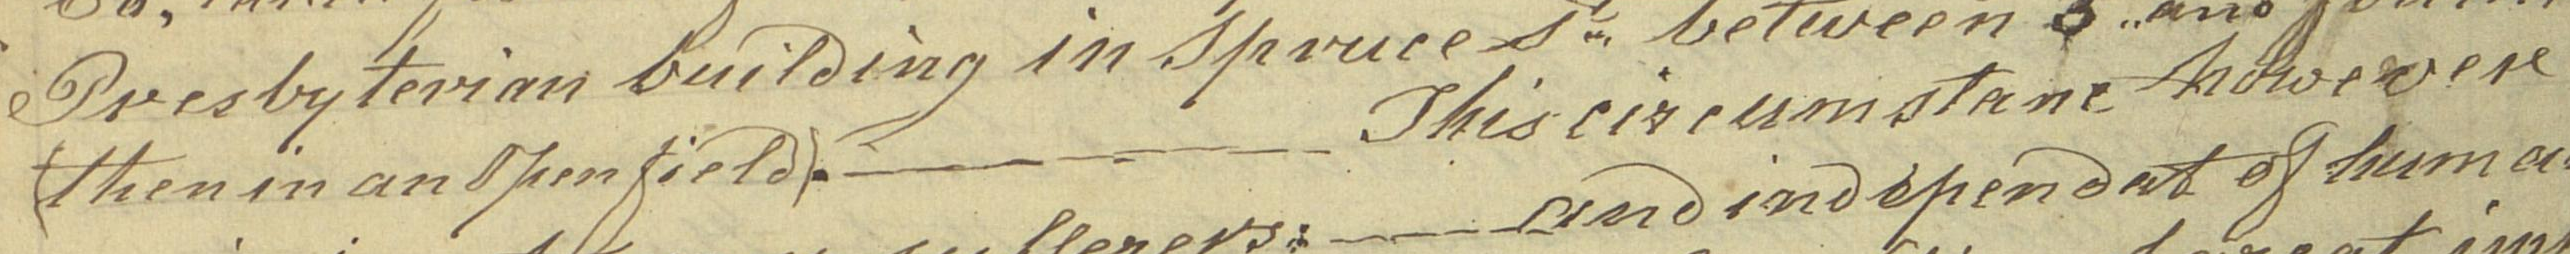(then in an open field). This circumstance however
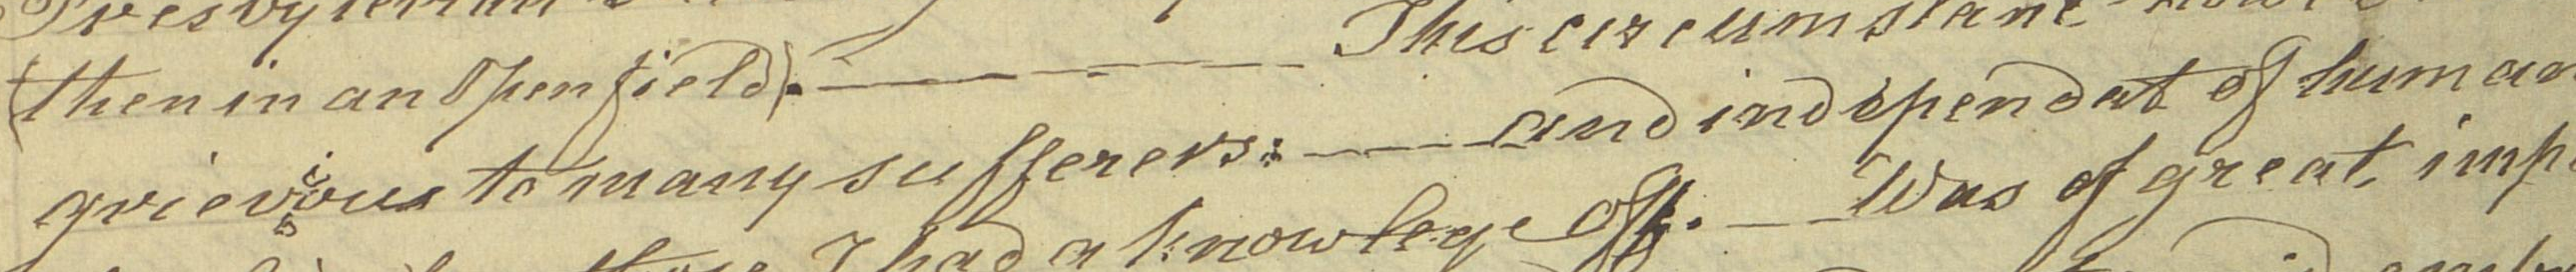grievous to many sufferers;- and independent of human
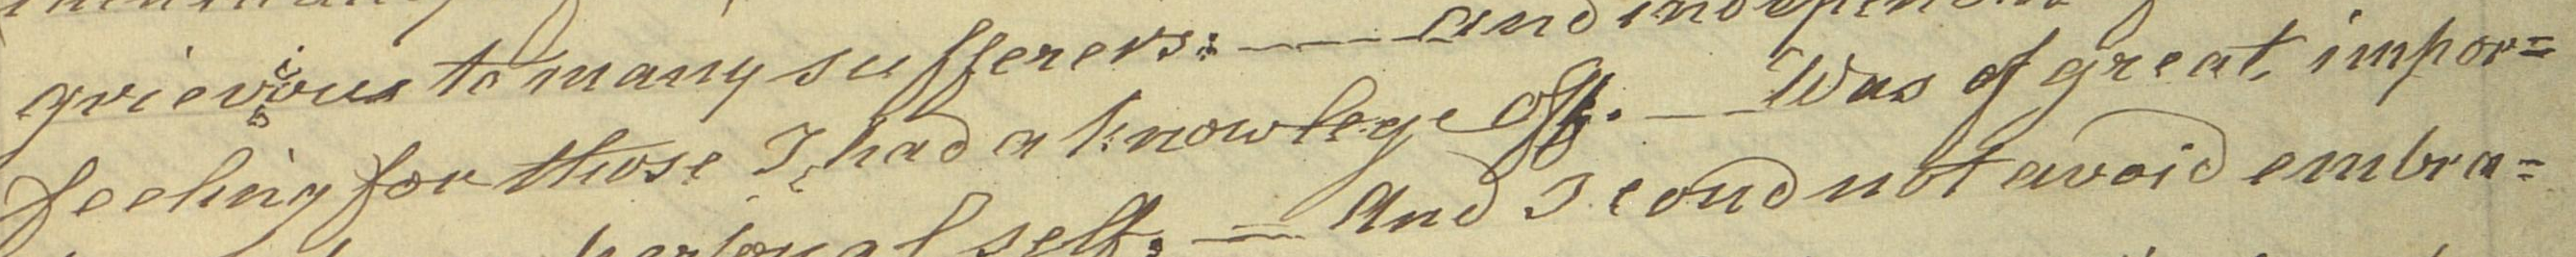feeling for those I had a knowledge off. Was of great impor-
